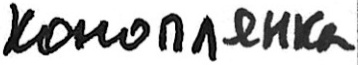коноплянка
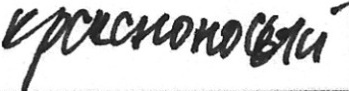красноносый
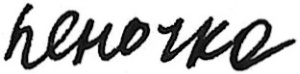пеночко
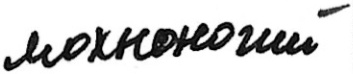мохноногий
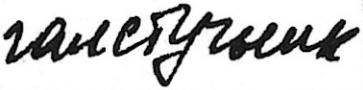галстучник
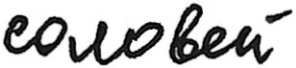соловей
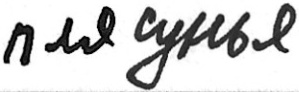плясунья
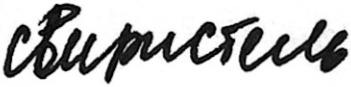свиристель
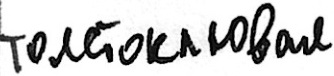толстоклювая
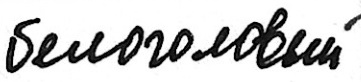белоголовый
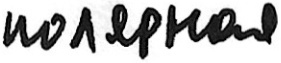полярная
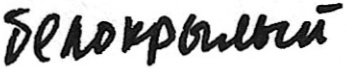белокрылый
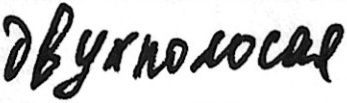двухполосая
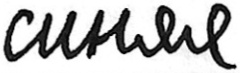синяя
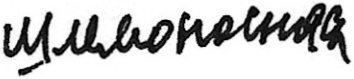шлемоносная
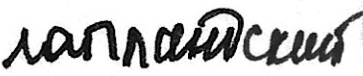лапландский
